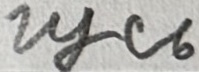гусь
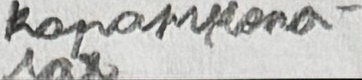короткопа-лах
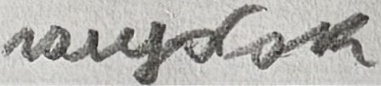голубок
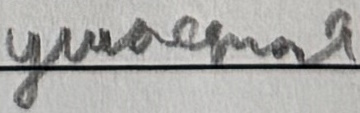ушастая
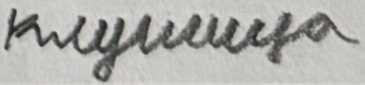клушица
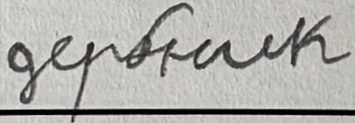дербник
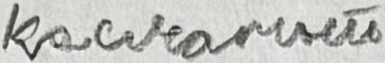касматый
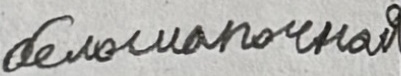белошапочная
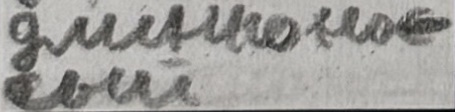длиннонос-сый
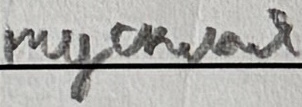тусклая
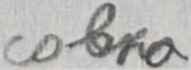совка
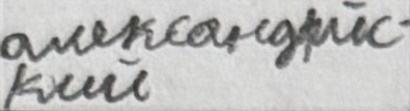александрйс-кий
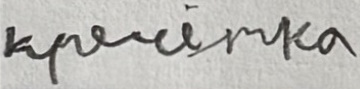кречётка
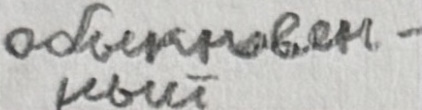обыкновен-ный
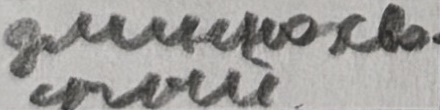длиннохво-стый
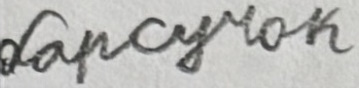барсучок
